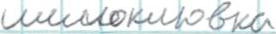шилоклювка
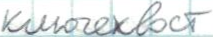ключехвост
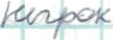нырок
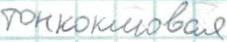тонкоклювая
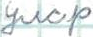улар
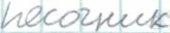песочник
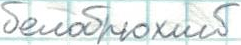белобрюхий
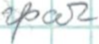грач
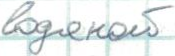водяной
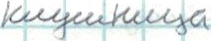клушница
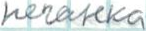пеганка
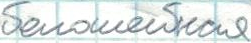белошейная
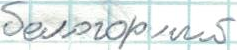белогорлый
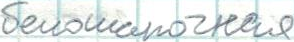белошапочная
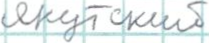якутский
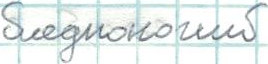бледноногий
